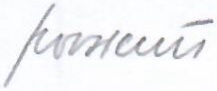рыжий
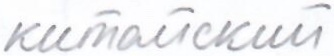китайский
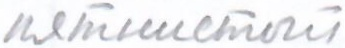пятнистый
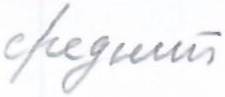средний
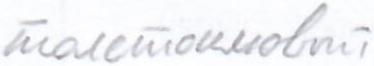толстоклювый
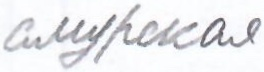амурская
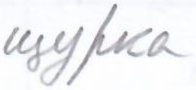щурка
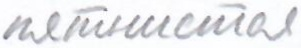пятнистая
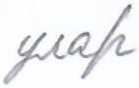улар
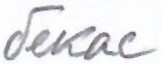бекас
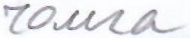чомга
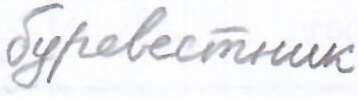буревестник
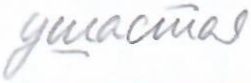ушастая
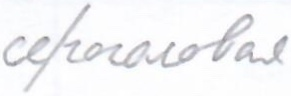сероголовая
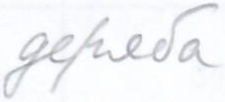деряба
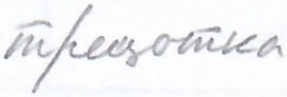трещотка
